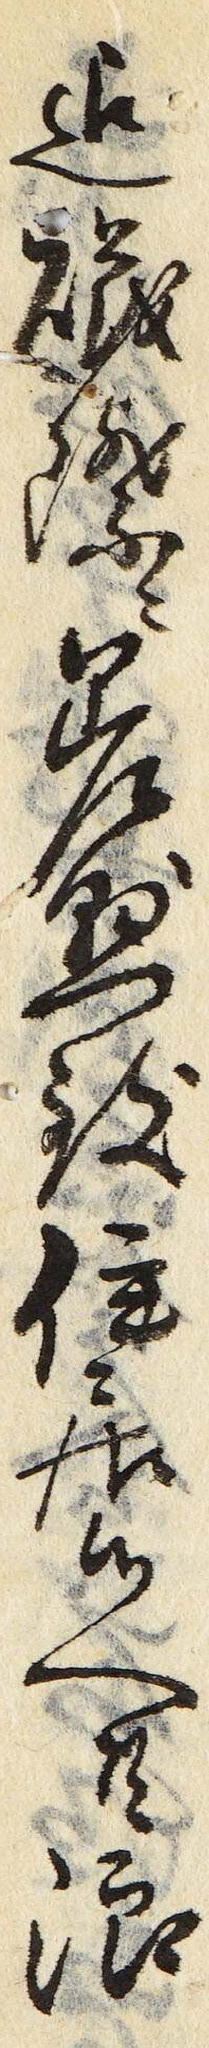迄磯際ニ差懸致住居候へ共浪
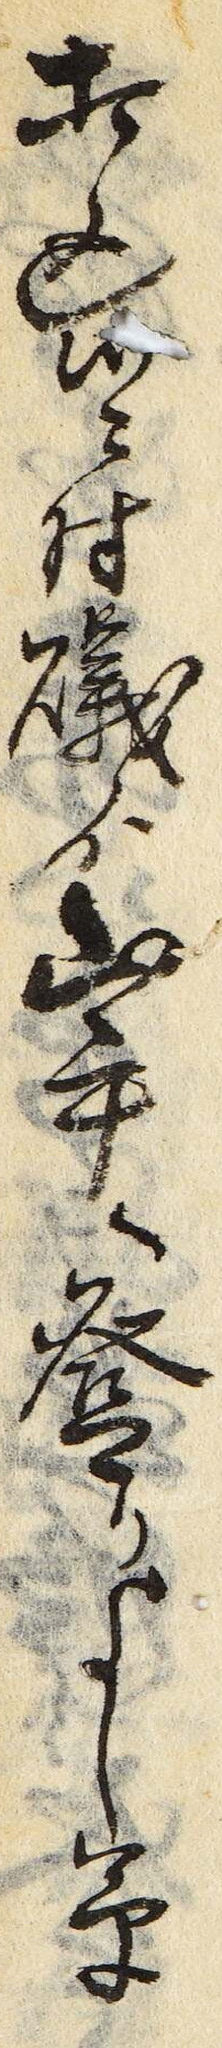打込候ニ付磯ゟ山手へ登りよし草

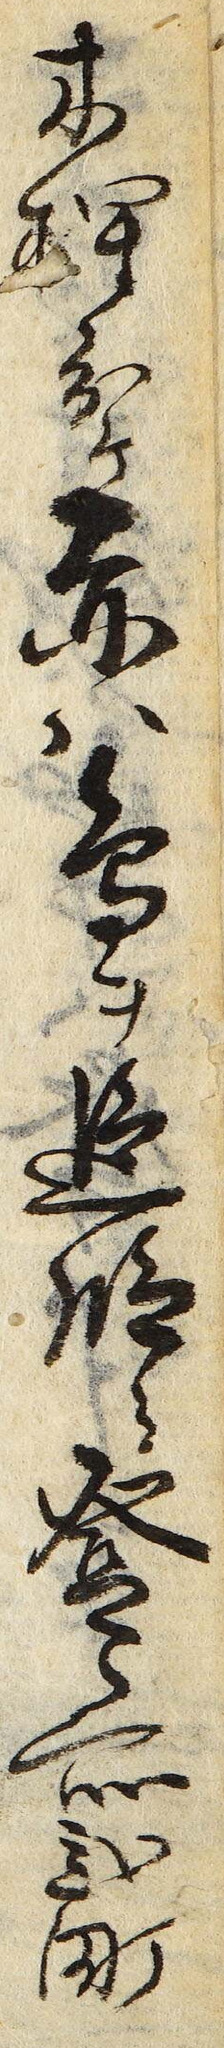木押分ケ亦ハ鳥ヲ追段々登候所弐町
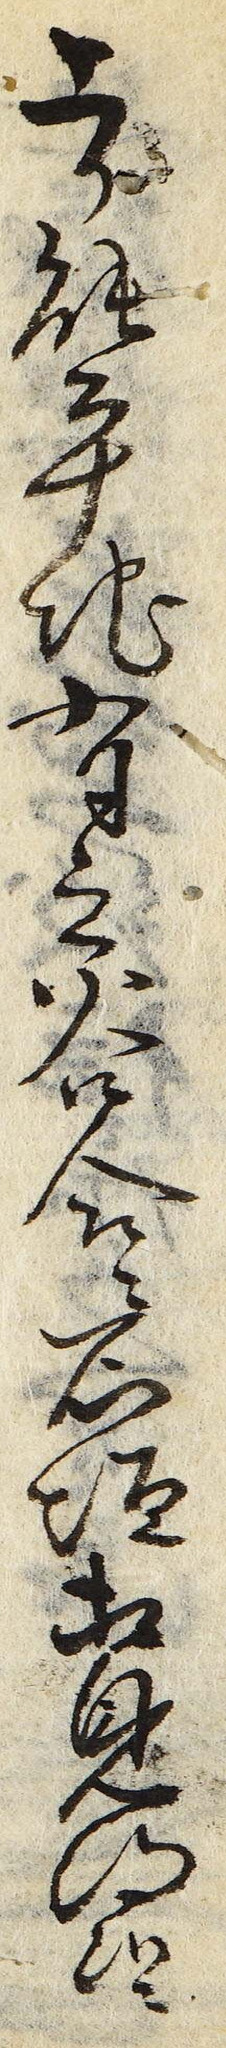上り能平地有之谷合ニ石垣相見得候ニ
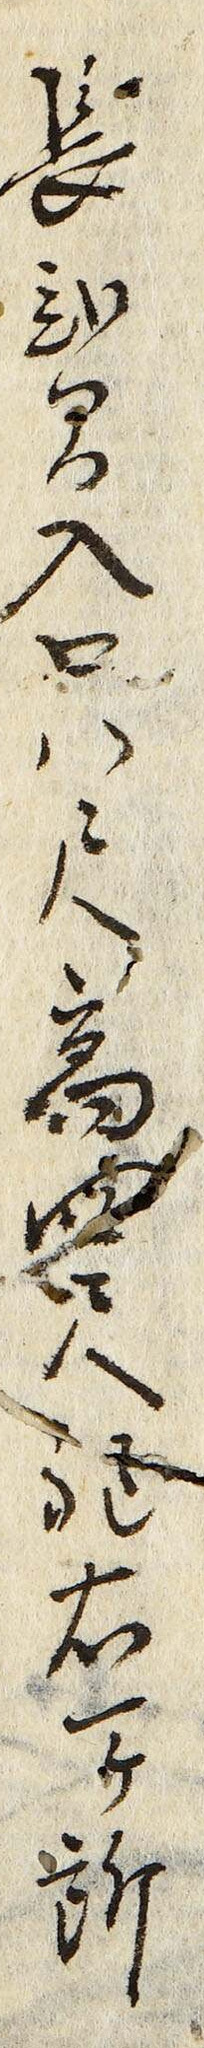長弐間入口八尺高四尺程右一ケ所
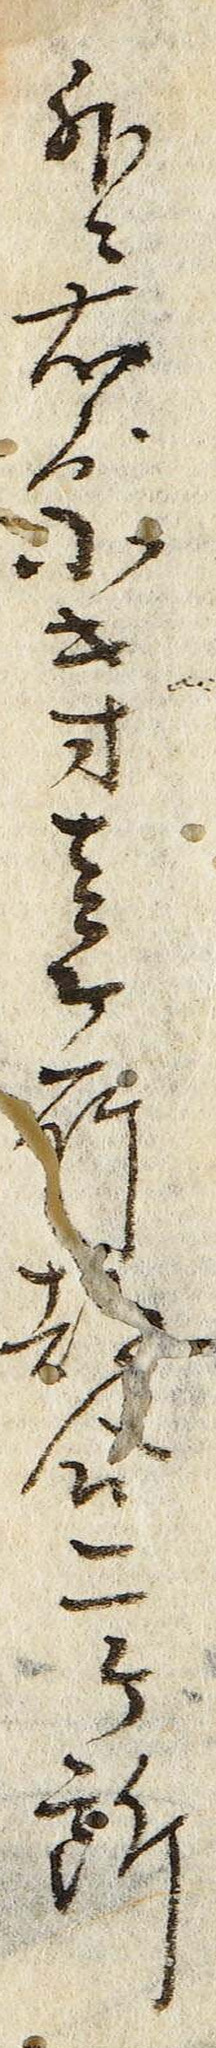外ニ右ゟ小キ方壱ケ所都合ニケ所
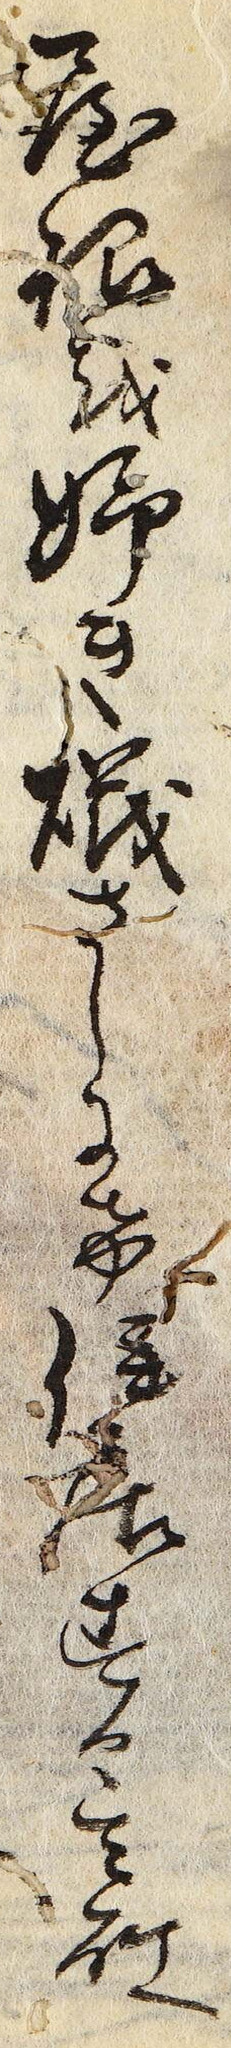屋根をふきさしかけ住居する其所へ
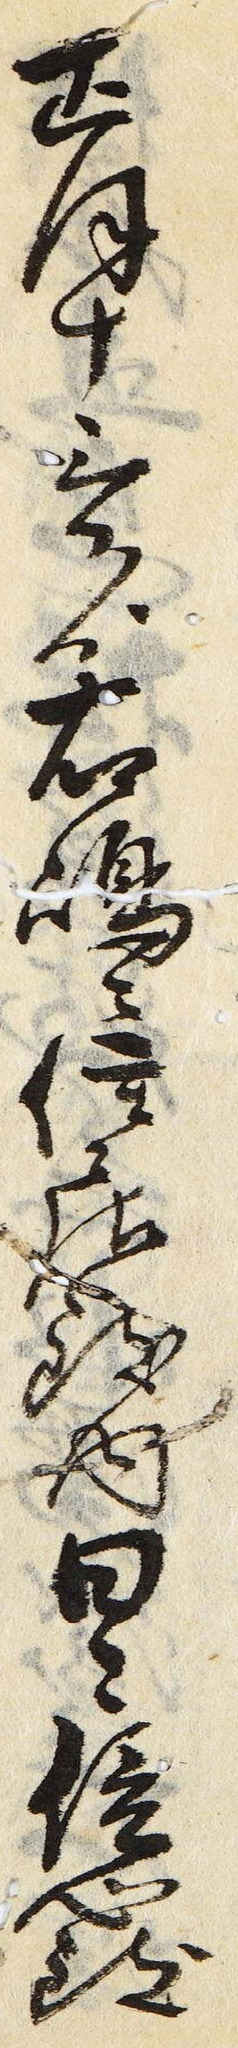正月十三日ゟ右嶋ニ住居致内日々信心致
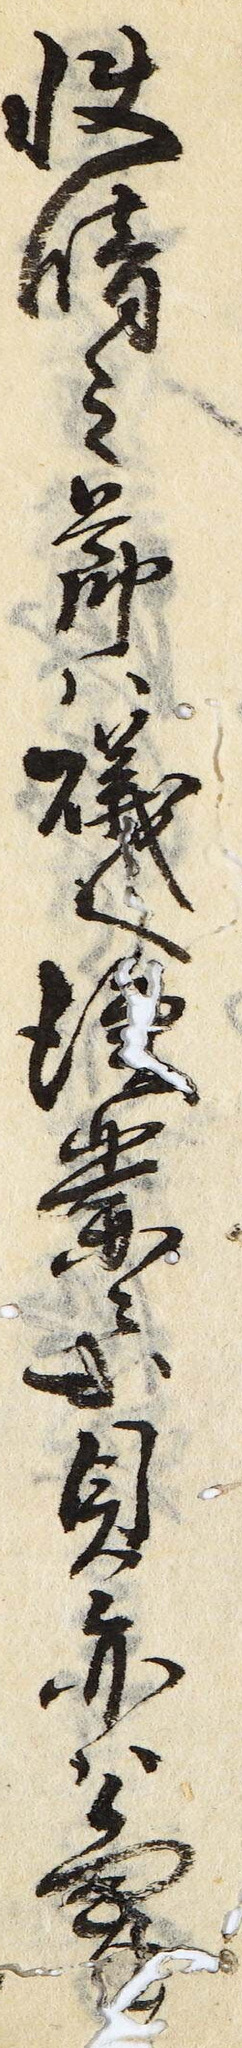快晴之節ハ磯へ漁業ニ出貝亦ハ魚ヲ
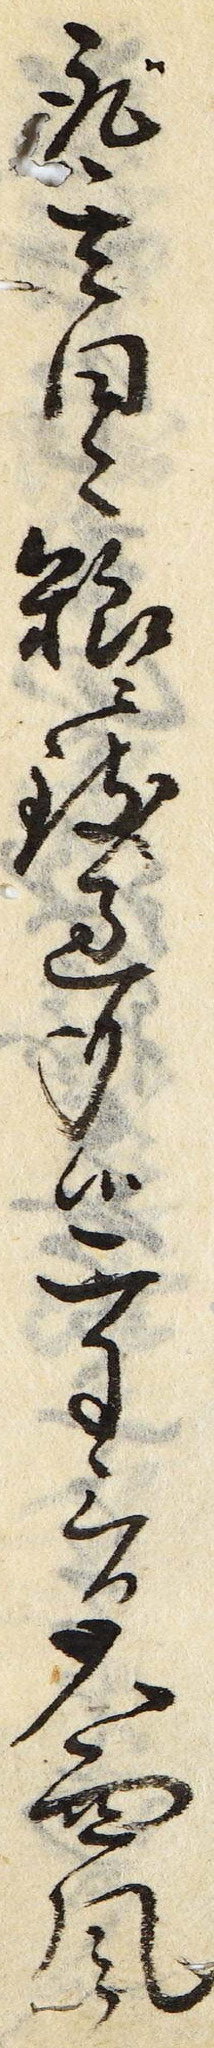取其日之粮ニ致過り候二月三日大西風
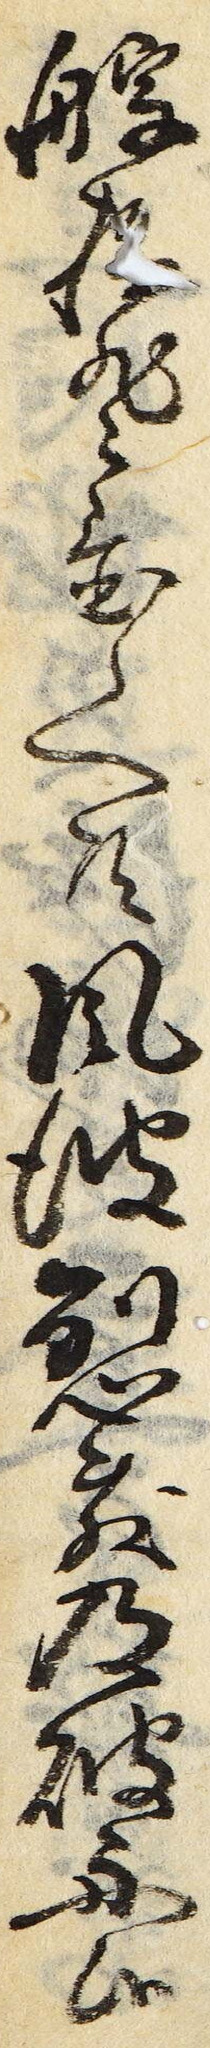艀ニ置候へ共風波烈敷及破舟候

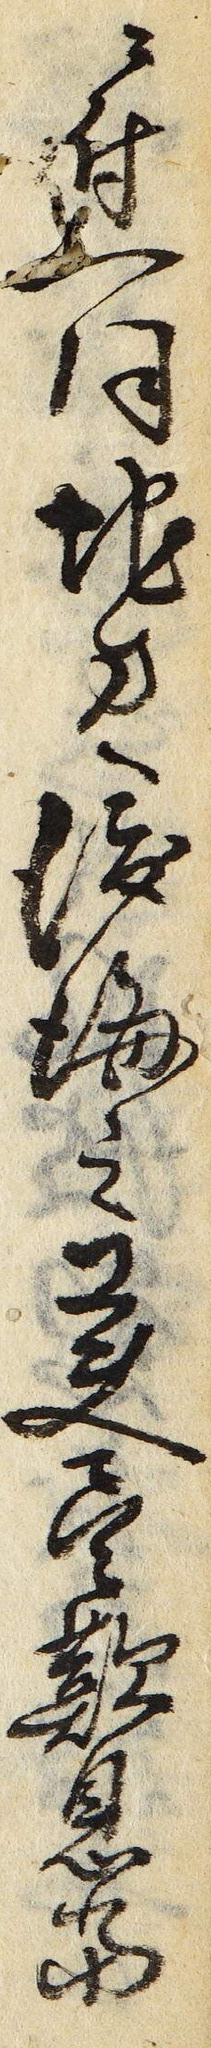ニ付一同地方へ渡海之工夫尽歎息当
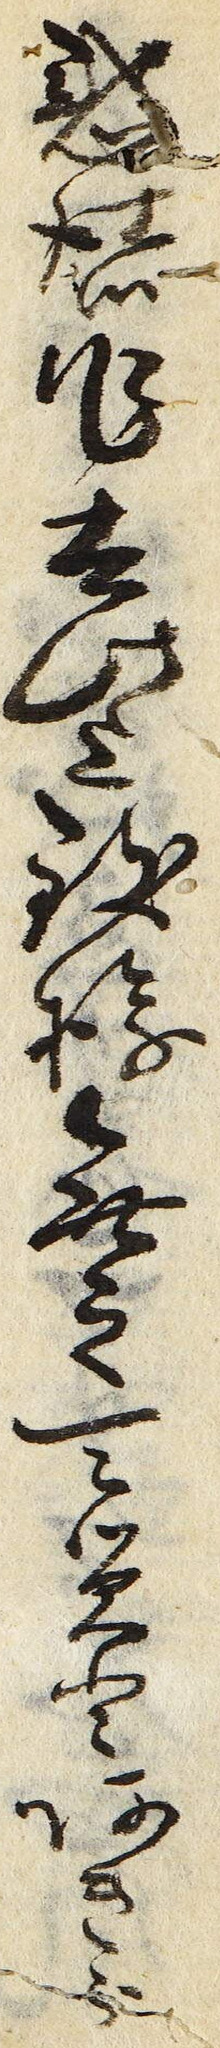惑仕候乍去此上致様無之天災とあきら
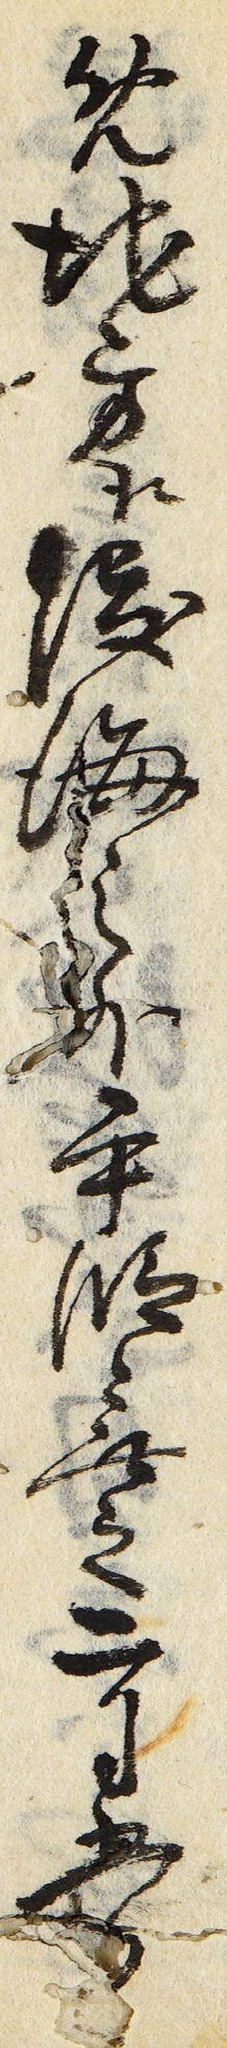め地方え渡海之外手段無之二月五日
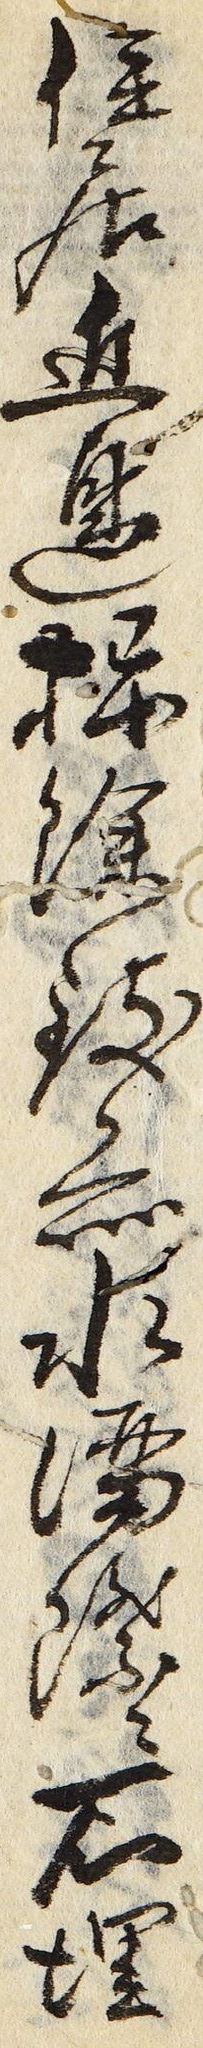住居近辺掃除致候所水溜際ニ石埋
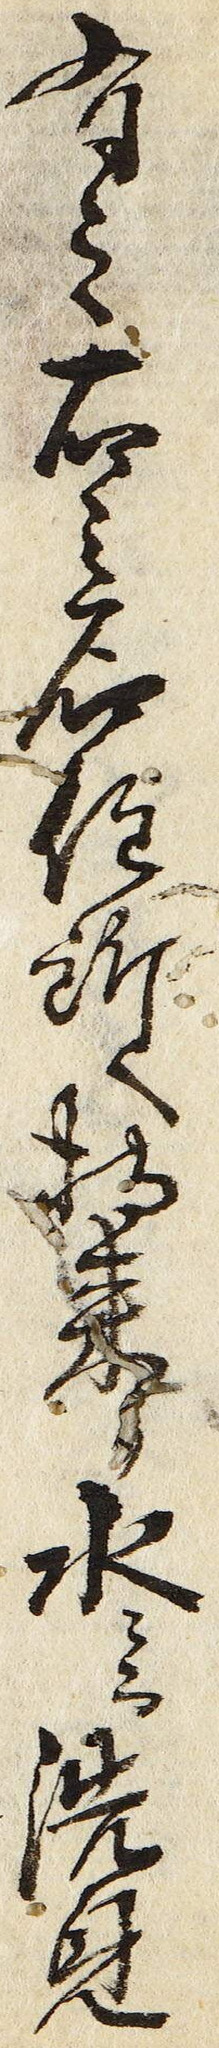有之右之石住所へ持来り水ニ而洗見
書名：阿波幸宝丸漂流記
